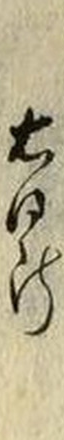右同断
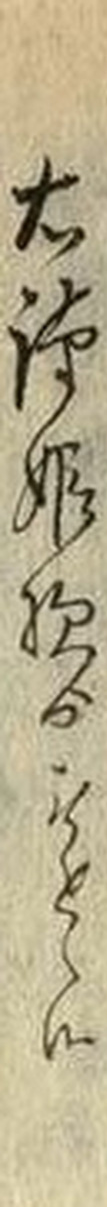右謹姫様ゟ被進之候
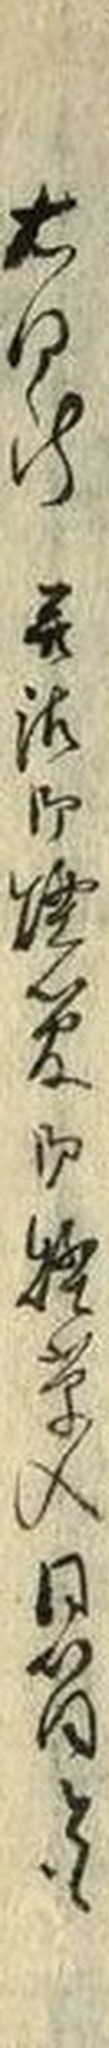右同断幷銀御煙管御煙草入同筒とも
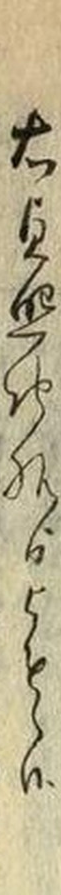右貞照院様ゟ被進之候
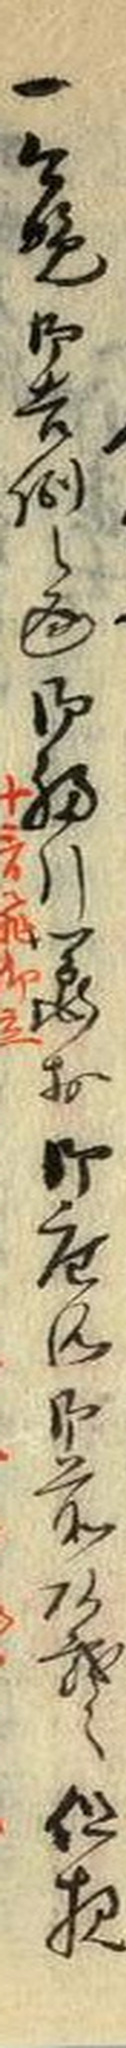一今晩御吉例之通御福引鬮於御座所御前頂戴之但夜
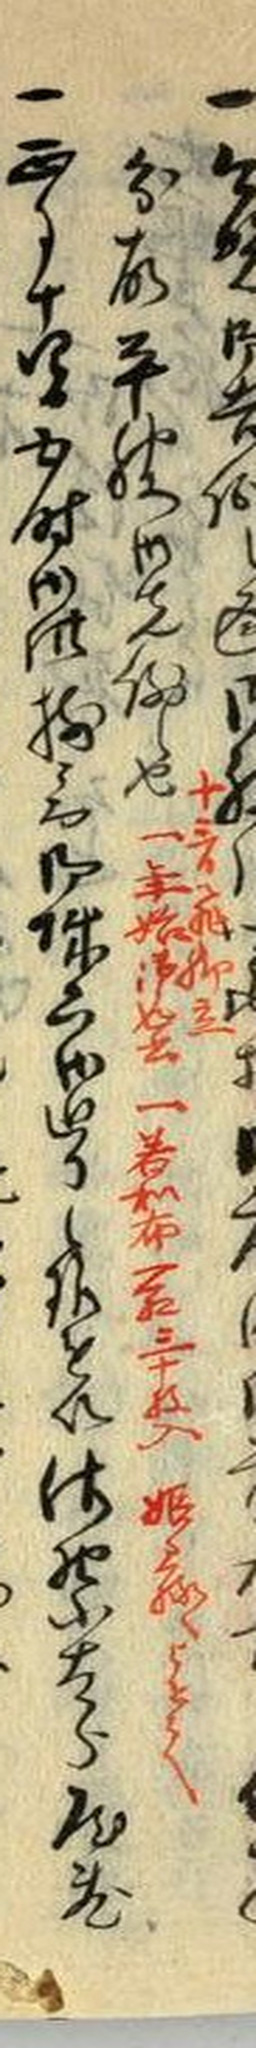一正月十四日五時御供揃ニ而御城下御廻り之趣を以佐野小太郎屋敷
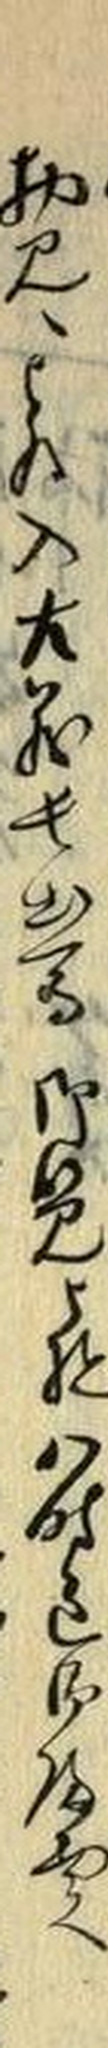物見へ被為入左義長出馬御覧被遊八時過御帰殿
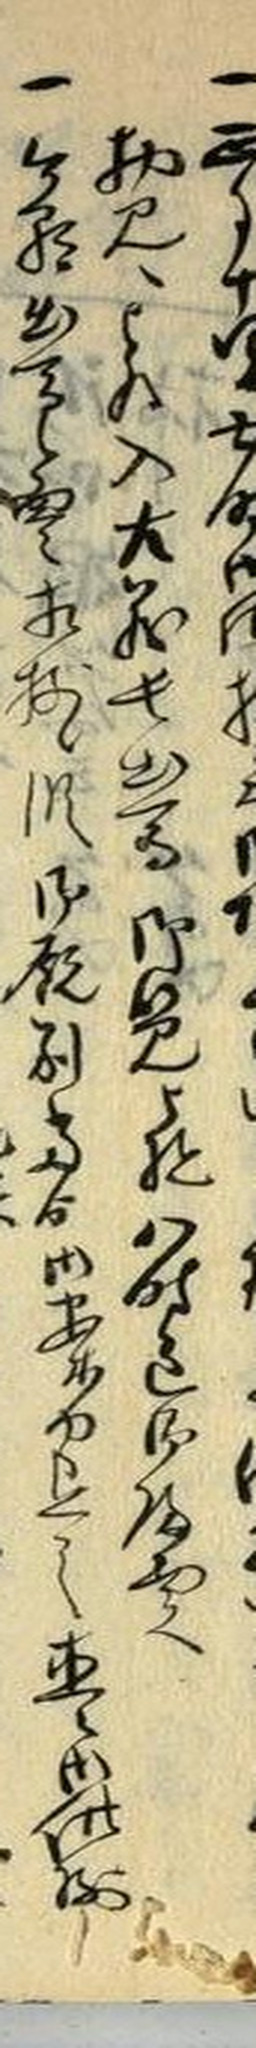一今朝出馬之面々相揃候段御厩別当ゟ御案内申上之直ニ御供揃
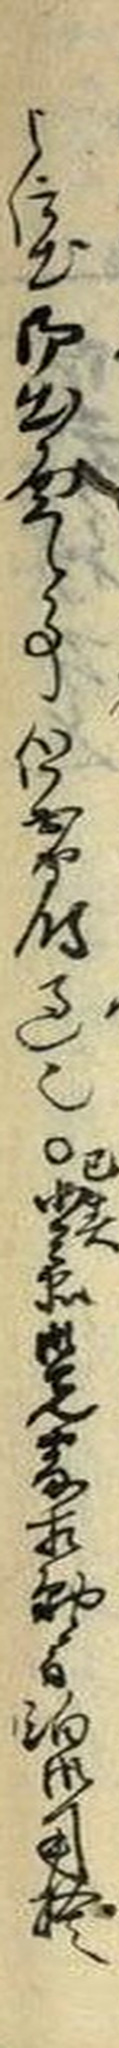被仰出御出殿候事但五半時過也〇己春小兵衛御先番相勤候ニ付泊御用捨
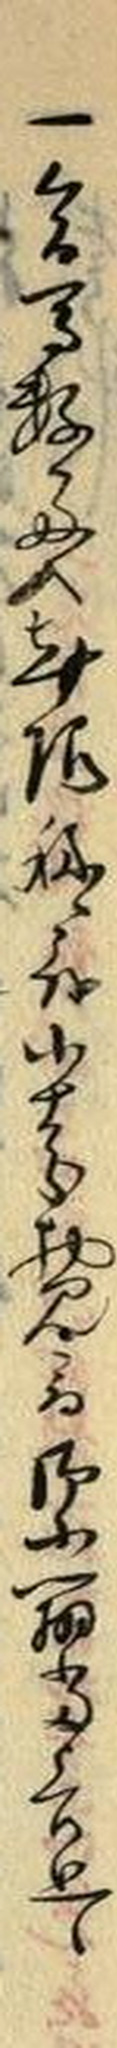一今日馬数多く刻限移候ニ付小太郎物見ニ而御小弁当被召上候
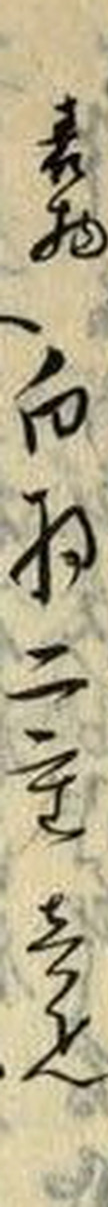表物白羽二重壱疋
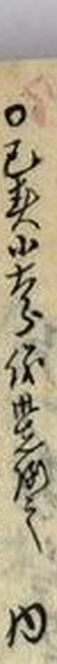〇己春小太郎儀御先例之
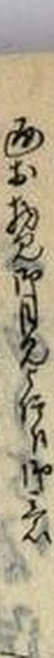通於物見御目見被仰付御意
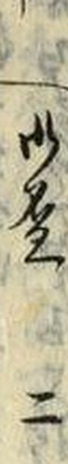御盃二
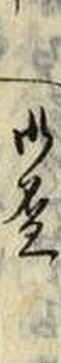御盃二
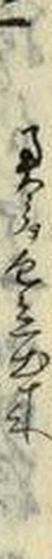奥ニ而包立出来
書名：少傅日録抄（斉承付側向頭取日記、在国）
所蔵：福井県文書館 Fukui Prefectural Archives
